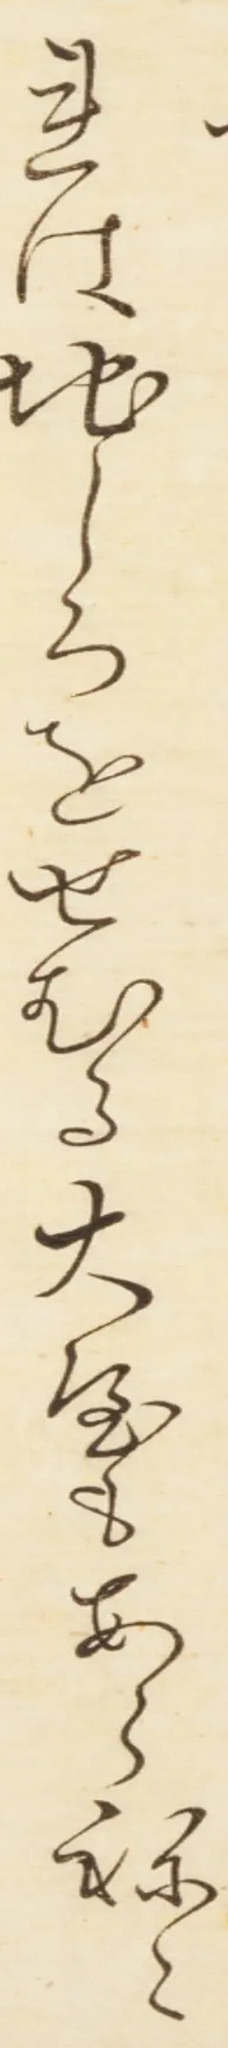れは地しろをせむる大屋もあらねと
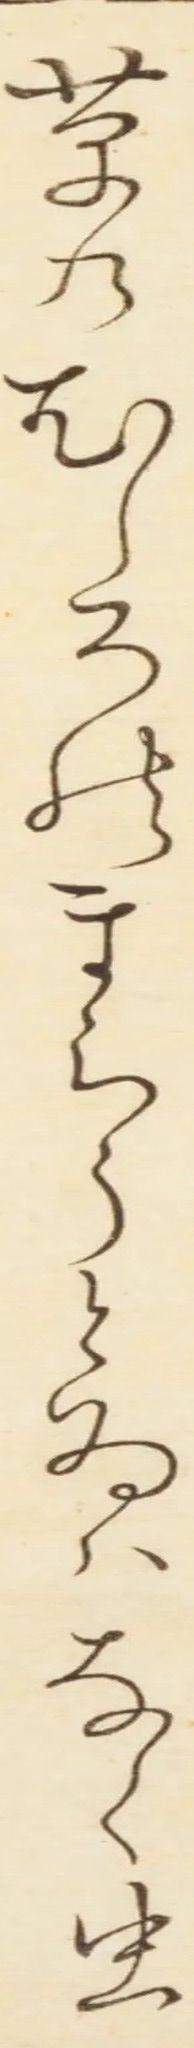草のむしろのまらうとゐはなく虫
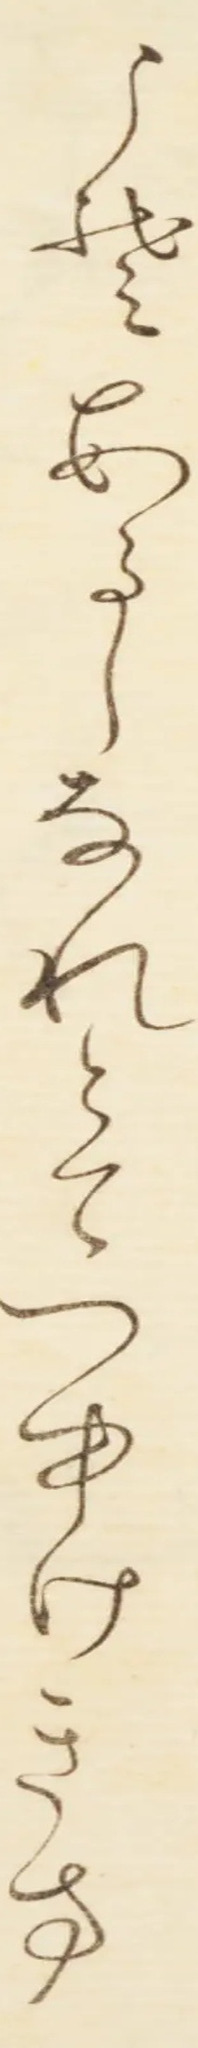こそあるしなれとてつゆけき方
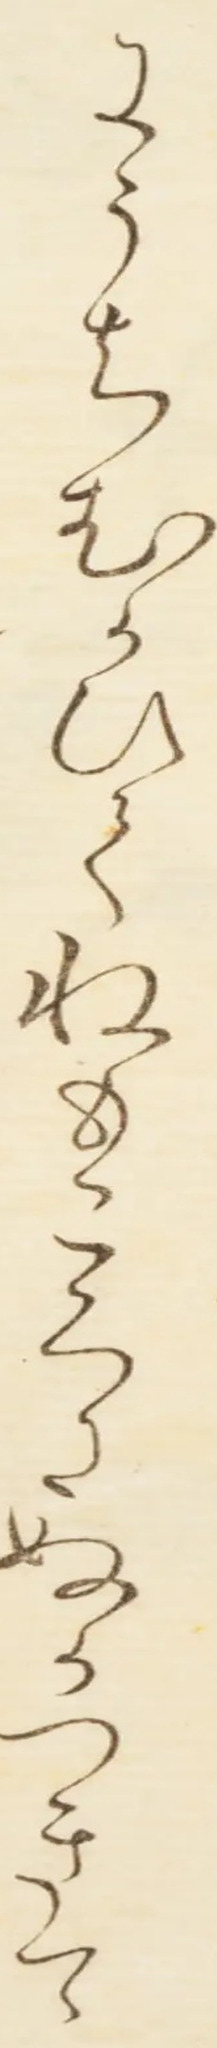にうちむかひてねもころにぬかつきて
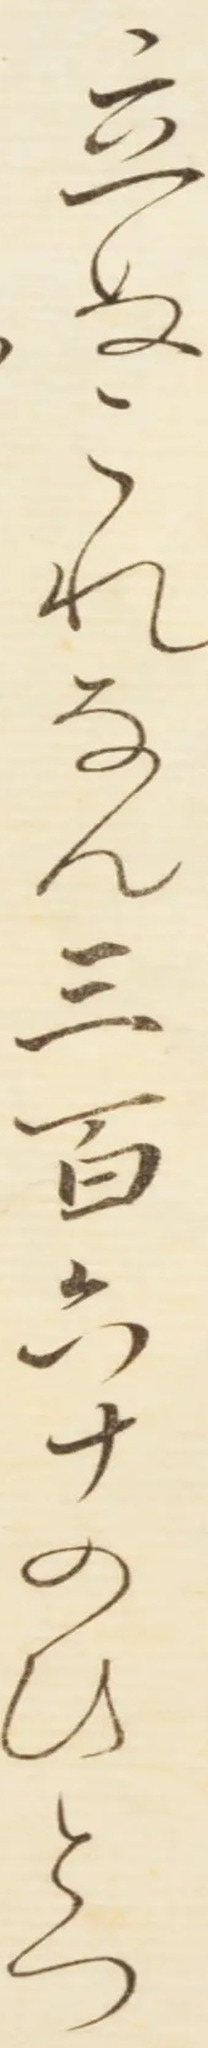立ぬこれなん三百六十のひとつ
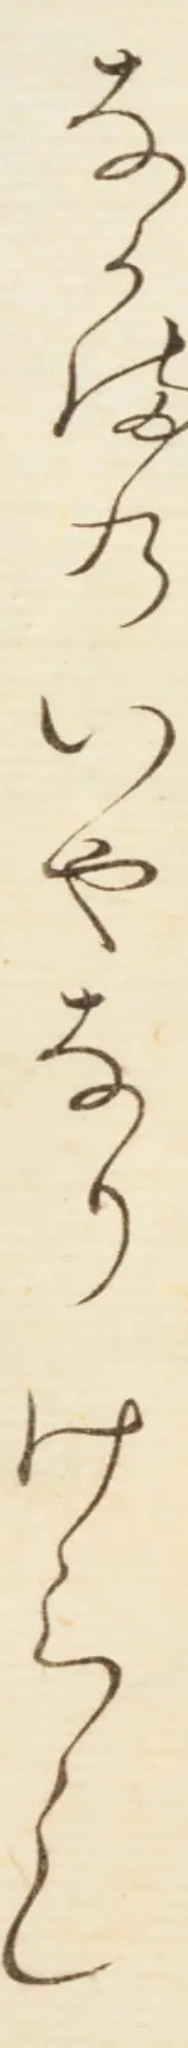なかまのいやなりけらし
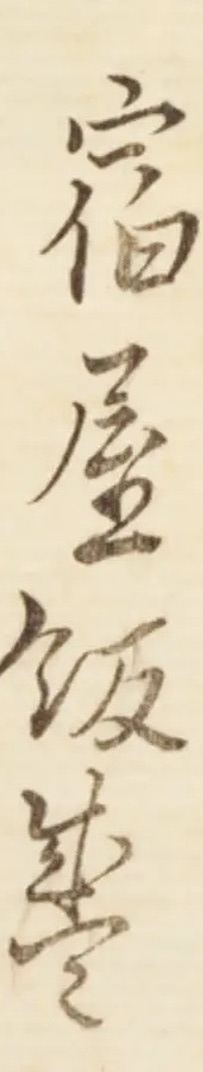宿屋飯盛
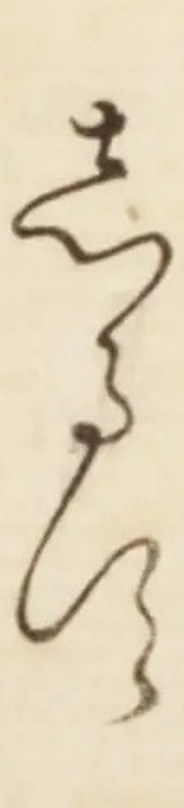しるす

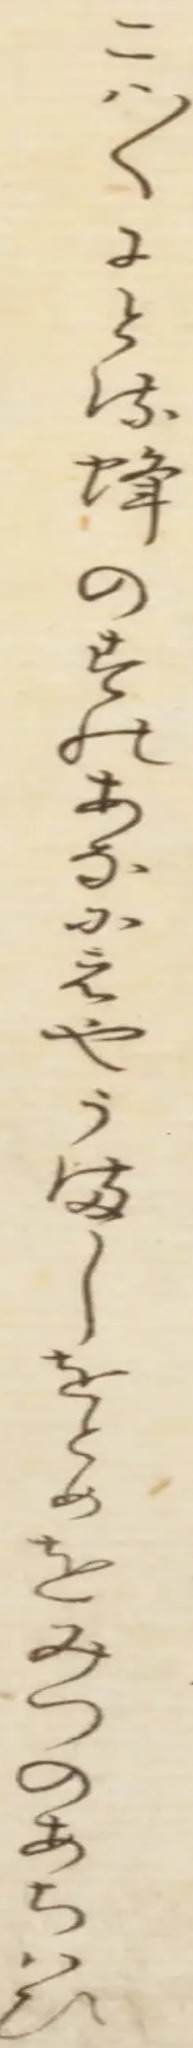こは〳〵にとる蜂のすのあなにえやうましをとめをみつのあちはひ
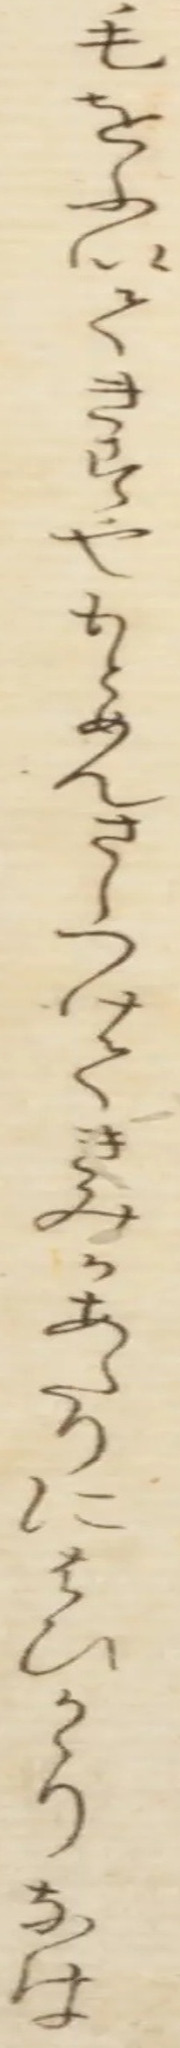毛をふいてきすやもとめんさしつけてきみかあたりにはひかゝりなは

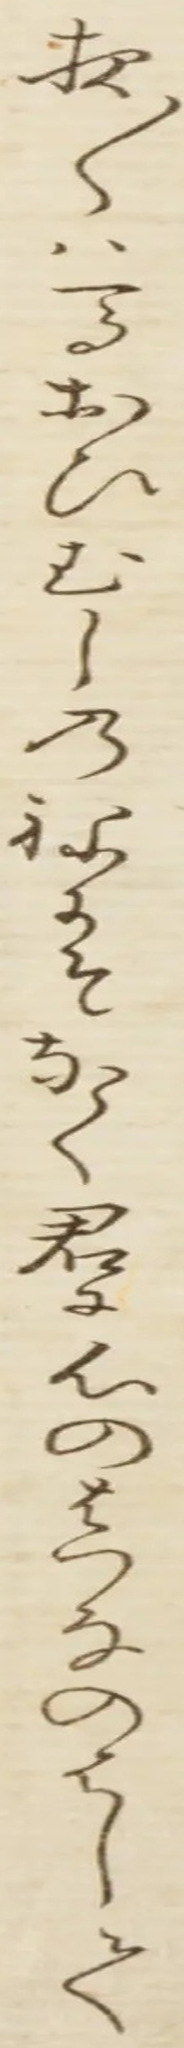夜〳〵は馬おひむしのねにそなく君に心のはつなのはして
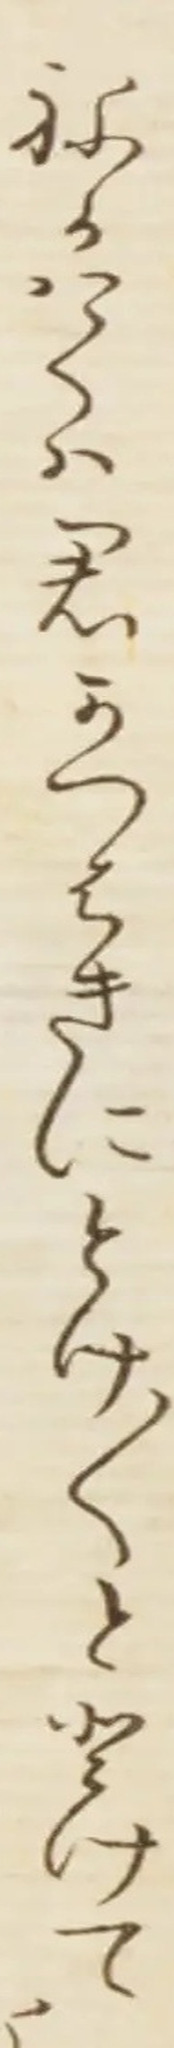ねかはくは君かつはきにとけ〳〵ととけて
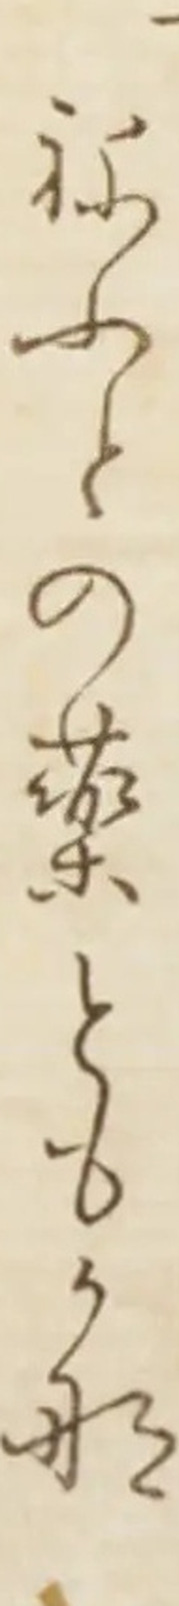ねふとの薬ともかな

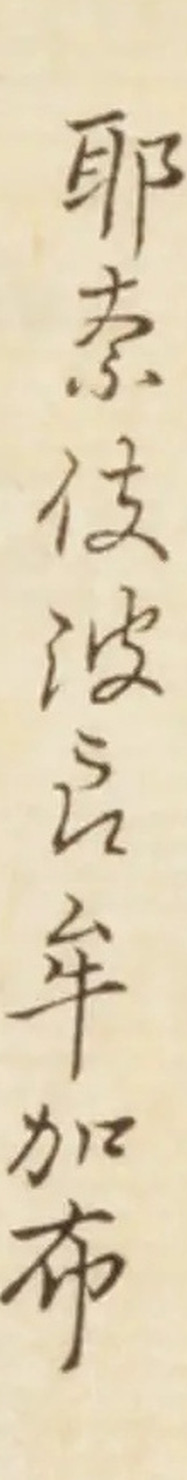耶奈伎波良牟加布
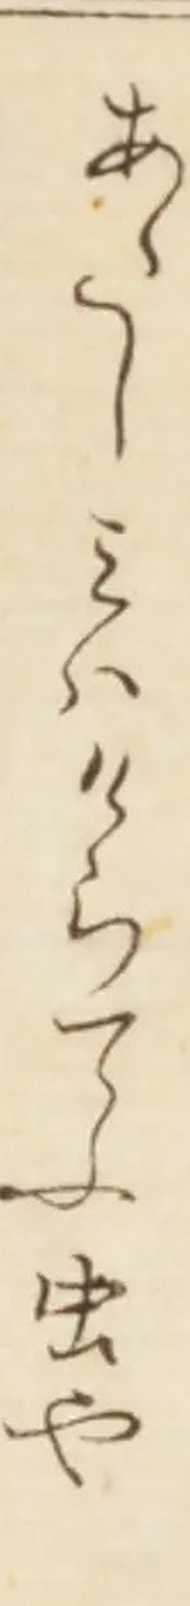あたしみはけらてふ虫や
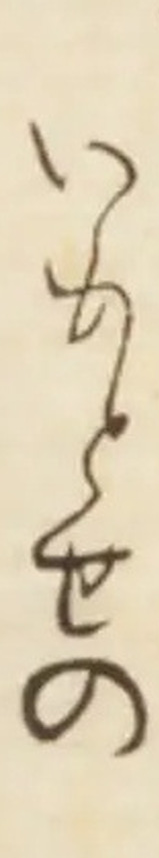いもとせの
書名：画本虫ゑらみ
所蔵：国立国会図書館 National Diet Library, JAPAN
